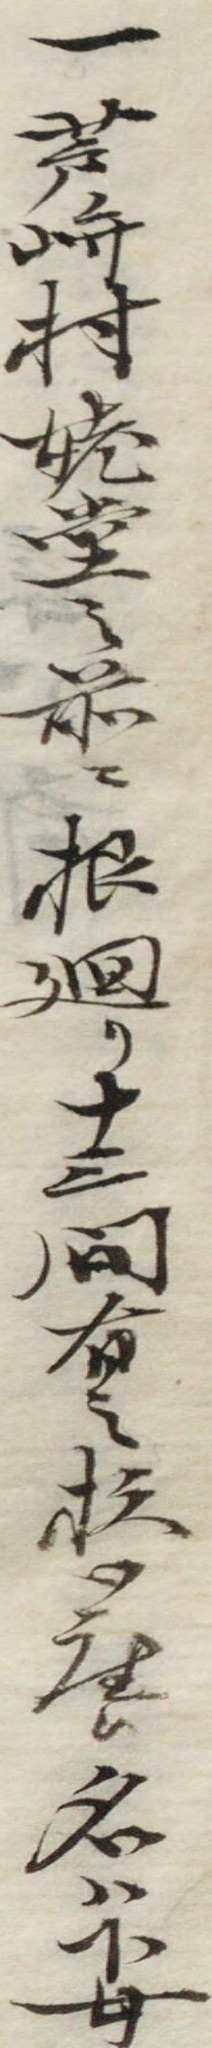一芦峅村姥堂之前に根廻り十三間有之杉御座候名は下女
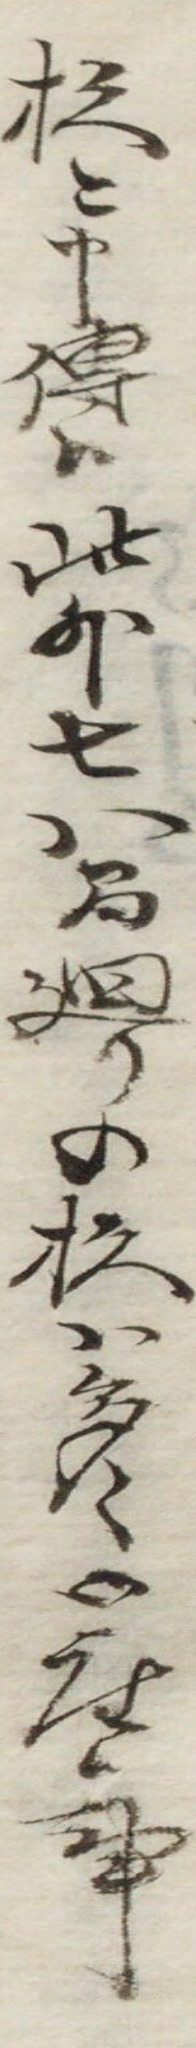杉と申伝候此外七八間廻りの杉は多く御座候事
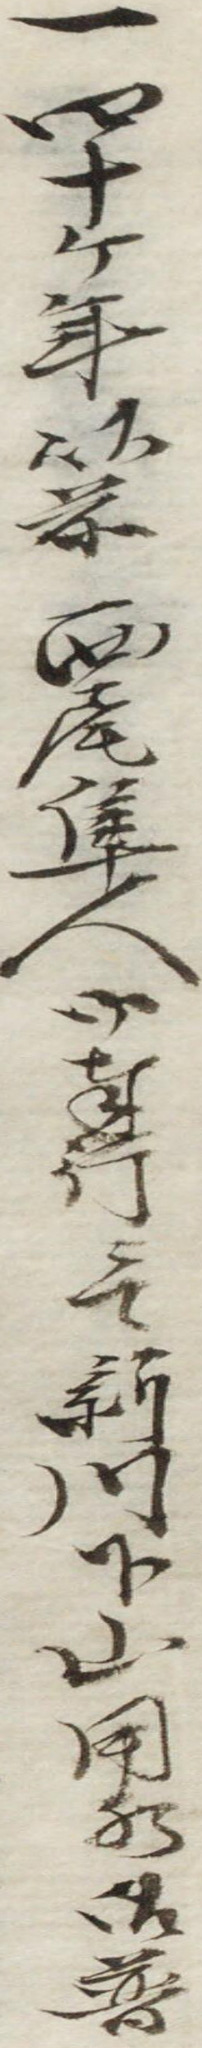一四十ヶ年以前西尾隼人御奉行にて新川下山用水御普
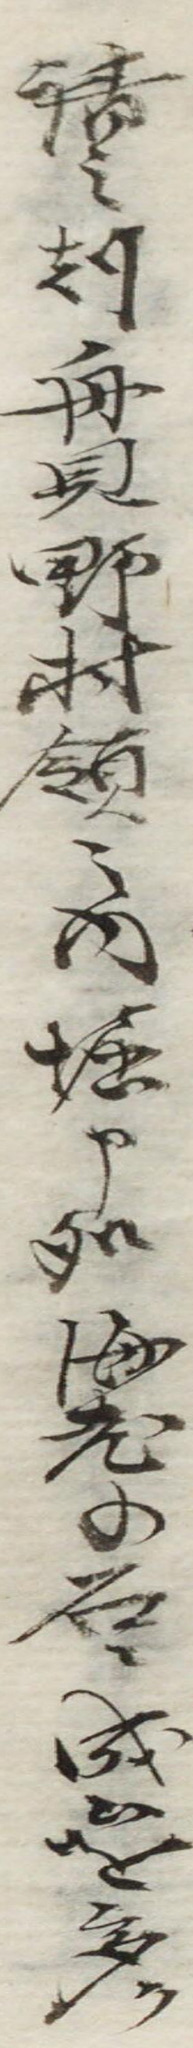請之刻舟見野村領之内堀申処海老の石に成候を多く
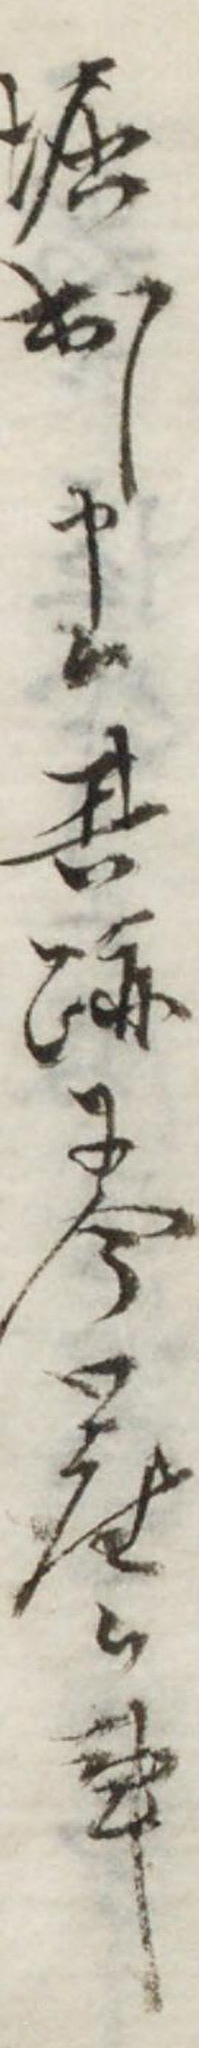堀出し申候其跡于今御座候事
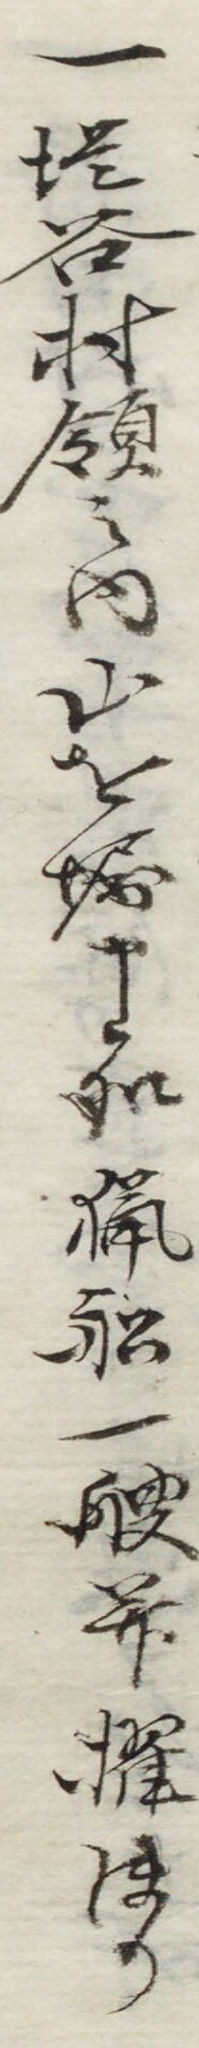一堤谷村領之内山を掘申候処猟船一艘并櫂ほり
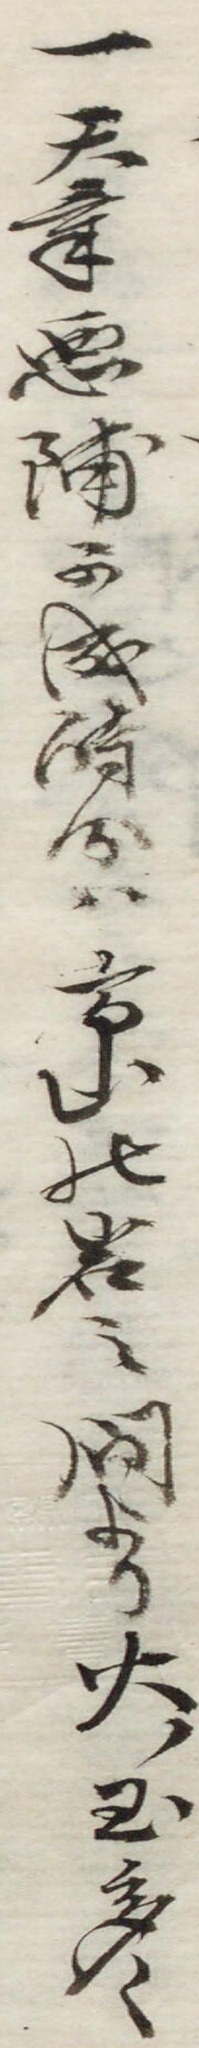一天気悪鋪可成時分は高山の岩之間より火ノ玉多く
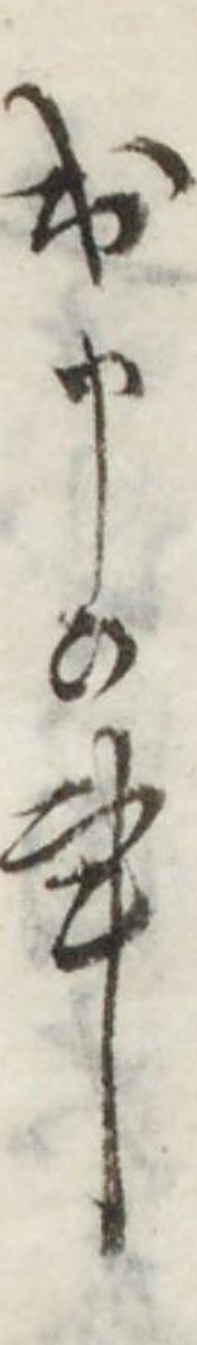出申候事
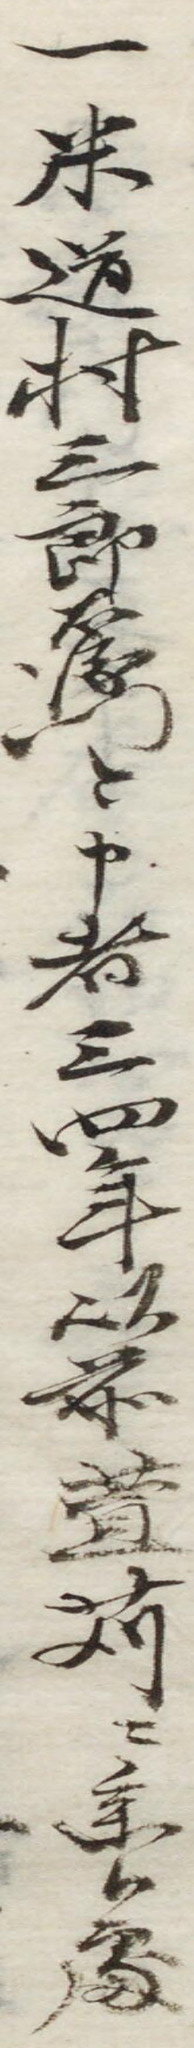一米道村三郎右衛門と申者三四年以前萱刈に参候処
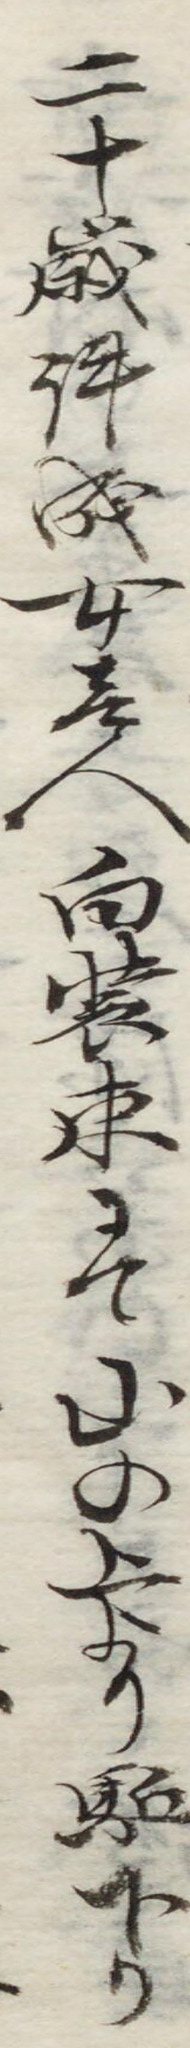二十歳許成女壱人白装束にて山の上より駈下り
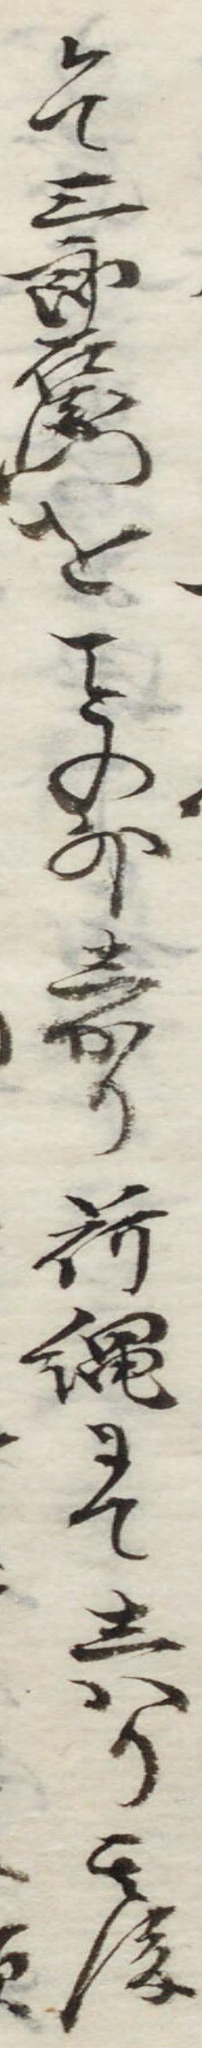候て三郎右衛門をことの外しかり荷縄にてしはり其後
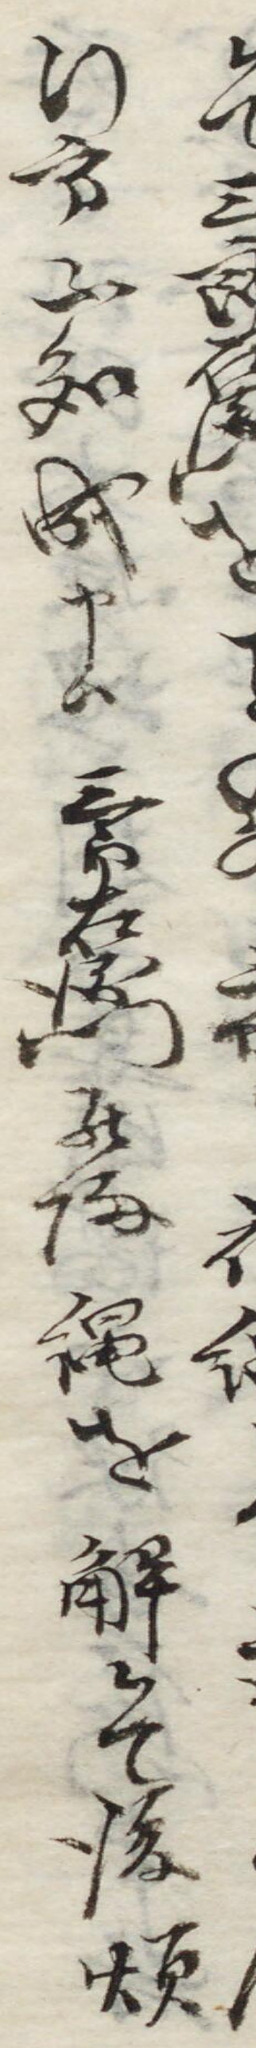行方不知成申候三郎右衛門罷帰縄を解候て後煩
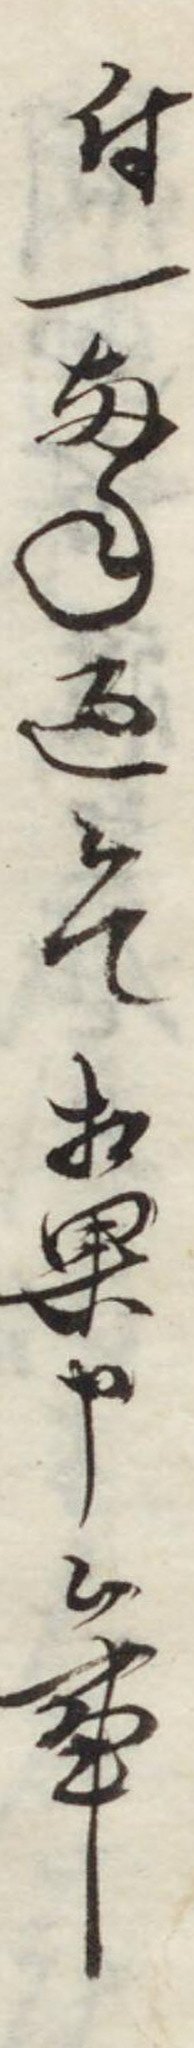付一両年過候て相果申候事
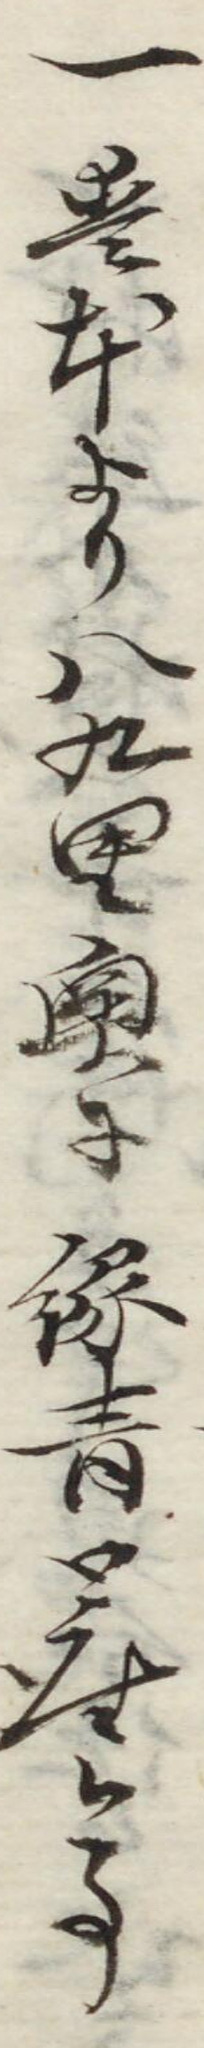一愛本より八九里奥に緑青御座候
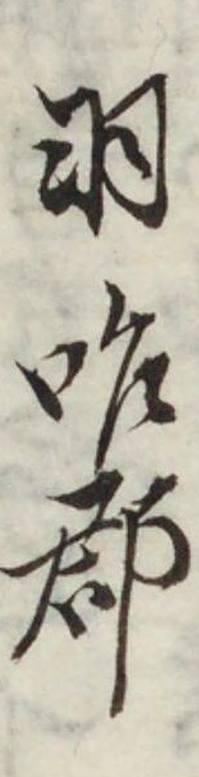羽咋郡
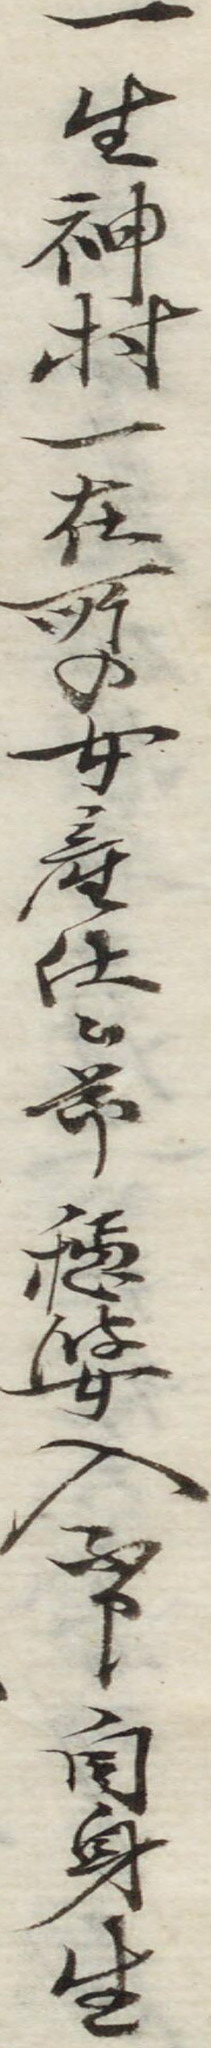一生神村一在所の女産仕候節穂婆入不申自身生
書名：古老旧聞紀略
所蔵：Ishikawa Prefectural Library
